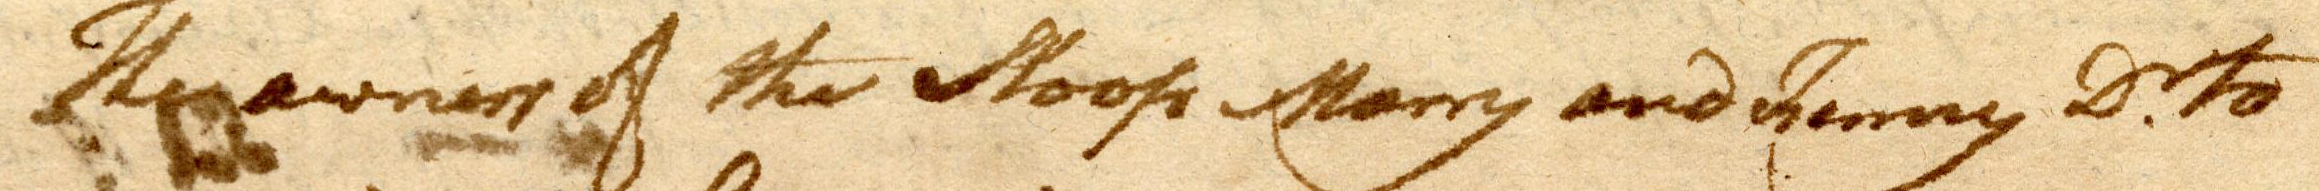The owners of the Sloop Marry and Fanny D^r to
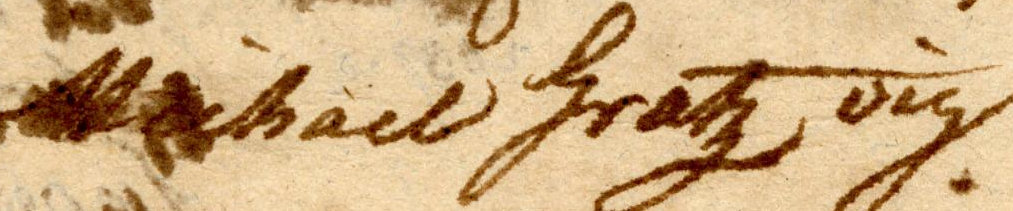Michael Gratz viz.
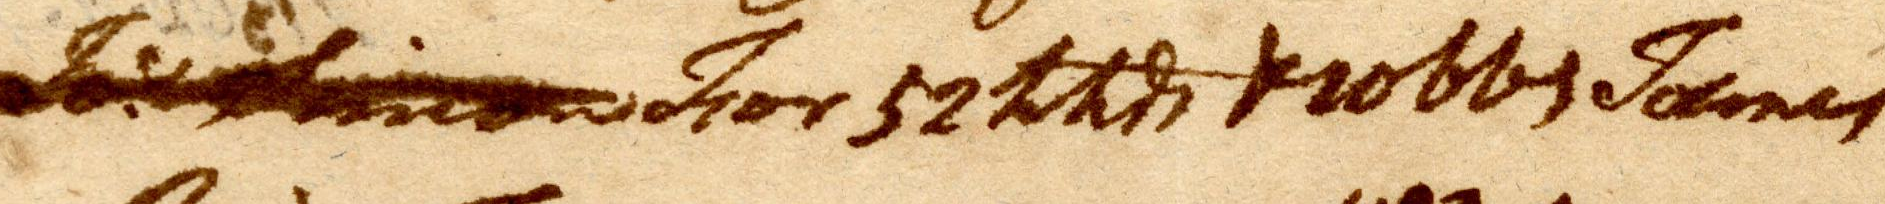[_________] for 52 hhds & robbs James
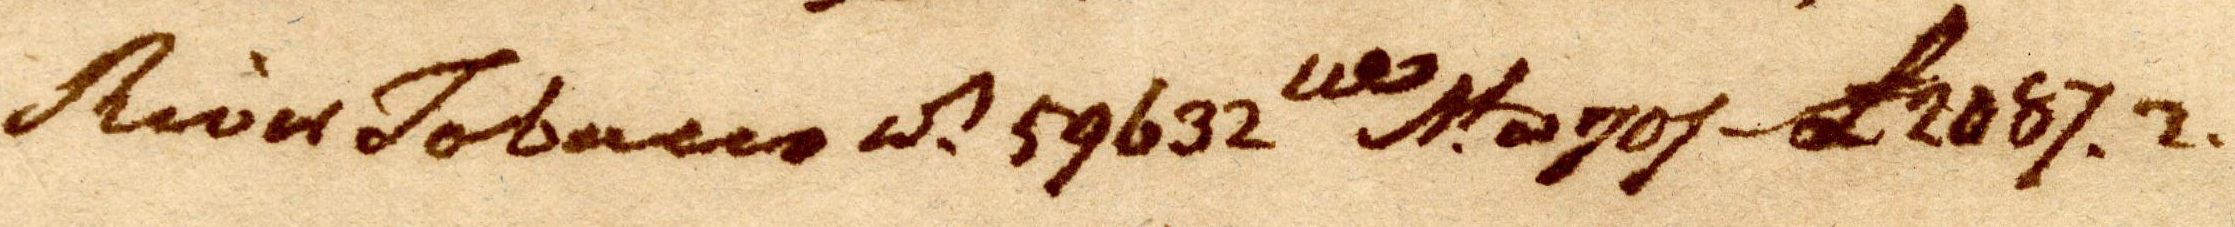River Tobacoo w^t. 59632 M^r 70s £2087.2.0
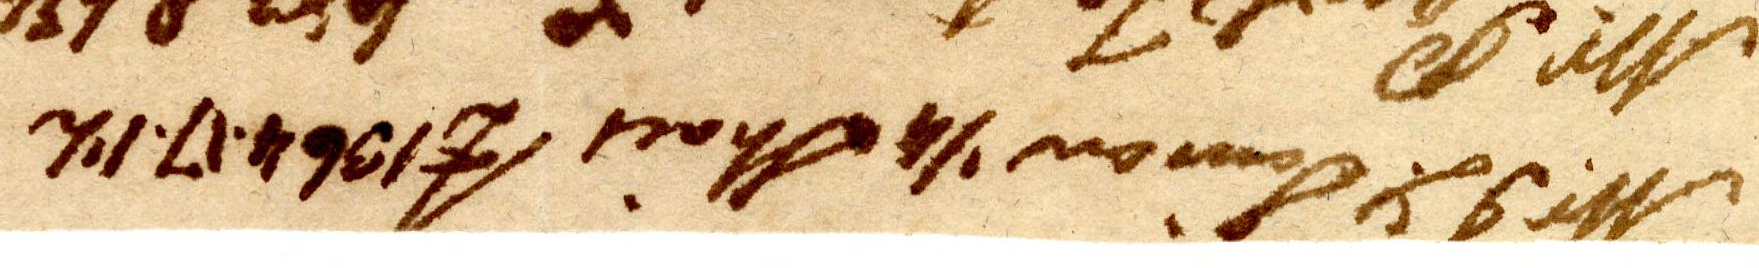M^r. I Y Simon 1/4 Share £.1364.17.1 1/2
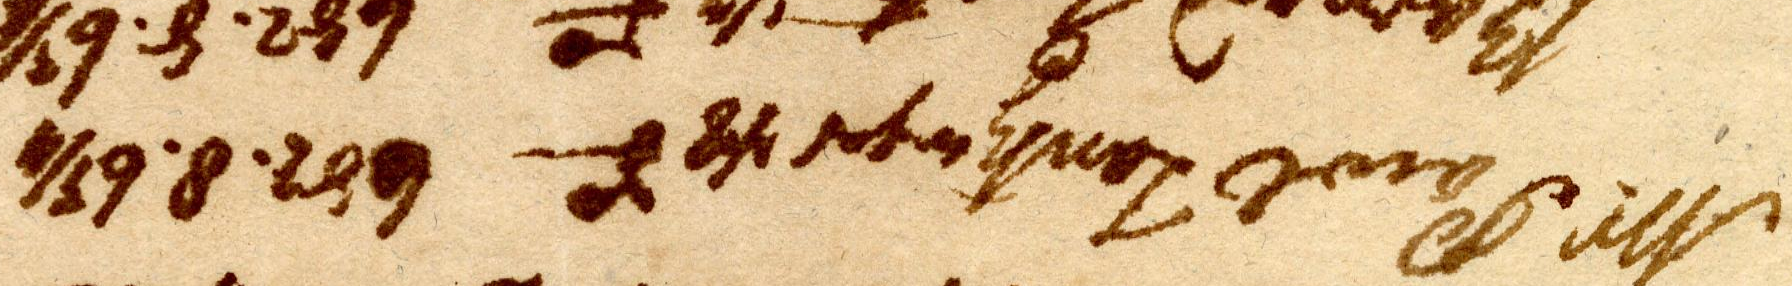Mr. Pawl Tantzager 1/8£ 682.8.6 3/4
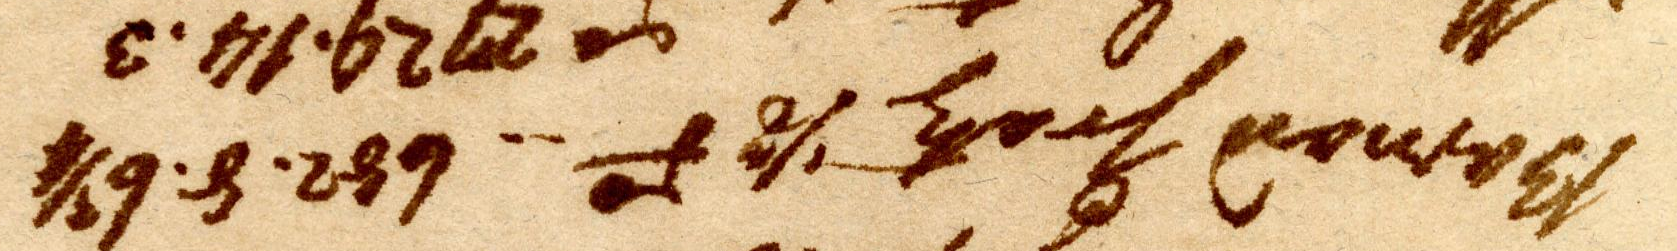Barnard Gratz 1/10^t £682.8.6 3/4
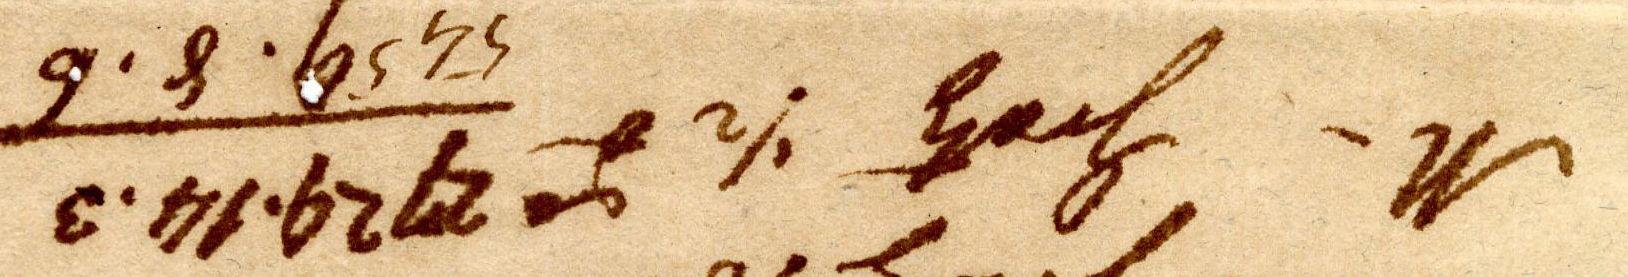M- Gratz 1/2 £429.14.3
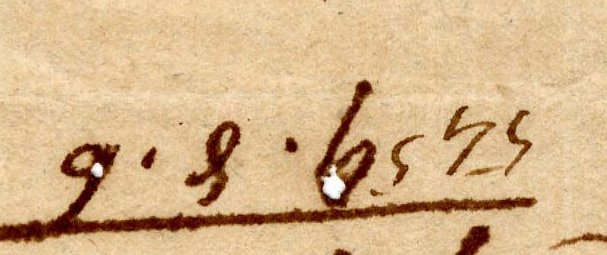5459.8.
